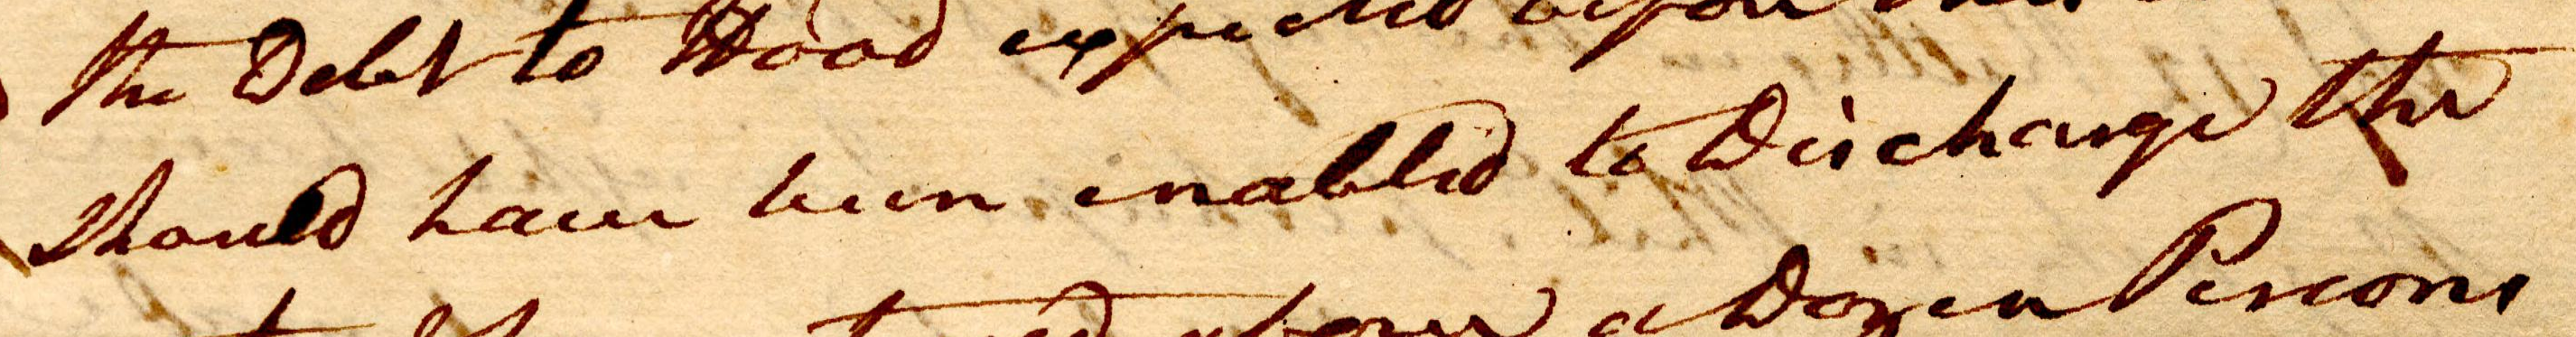should have been enabled to Discharge the
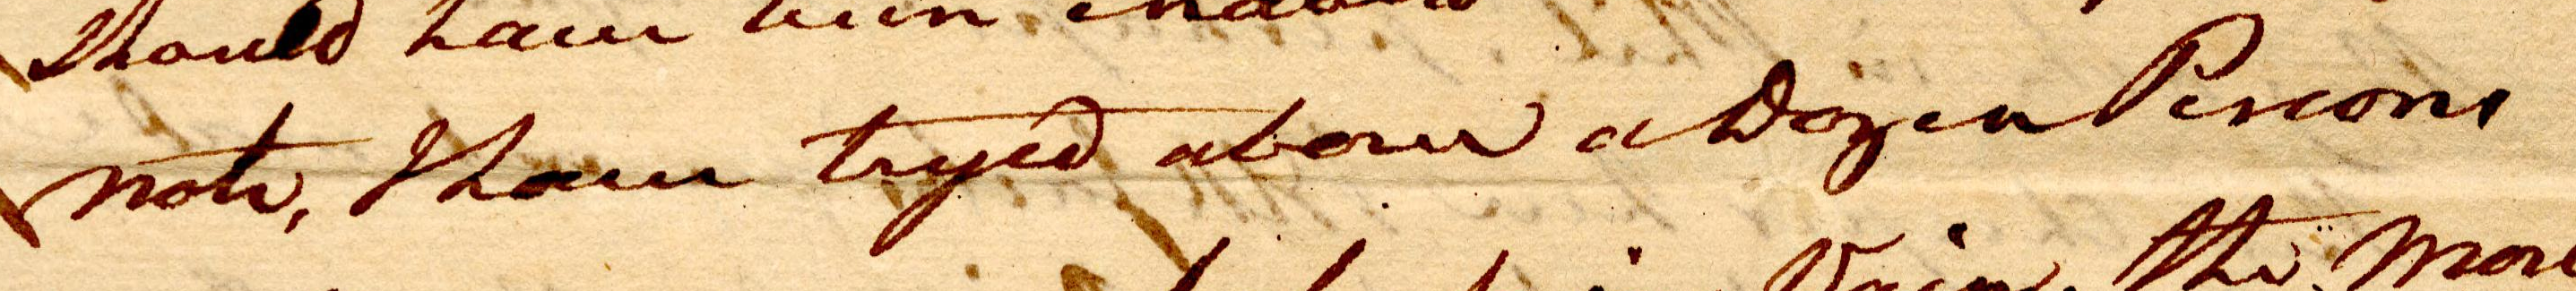note, I hove tryed about a Dozen Persons
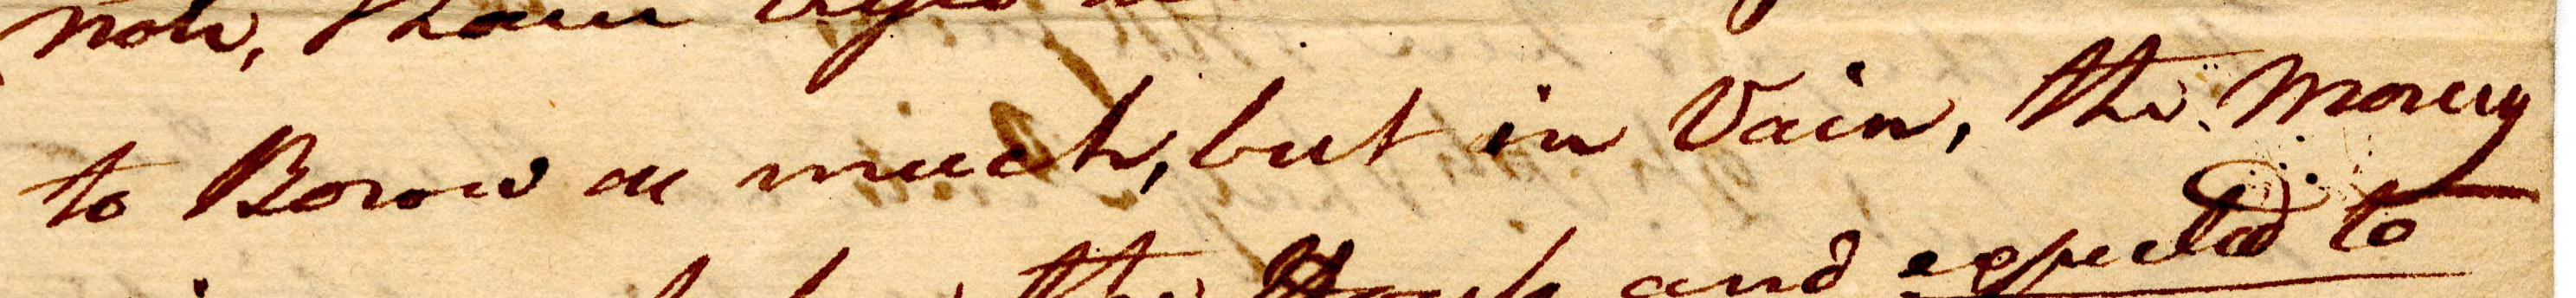to Borow as much, but in Vain, the money
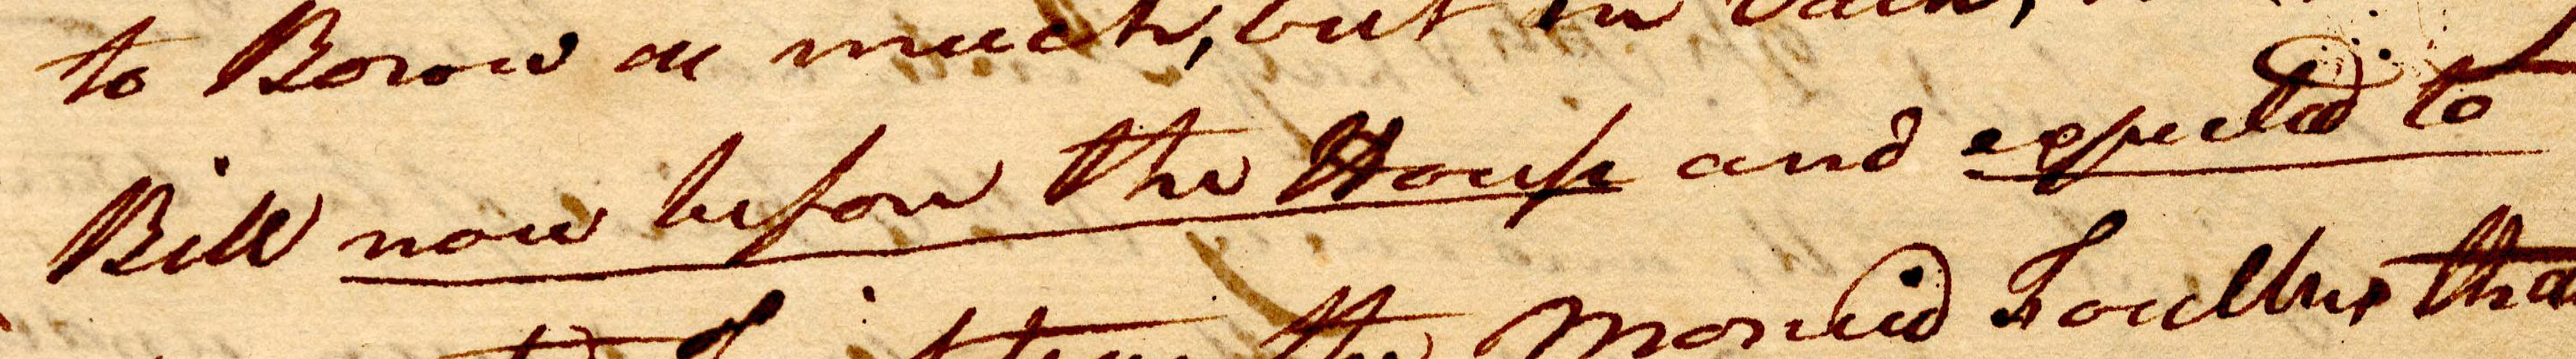Bill now before the House and expected to
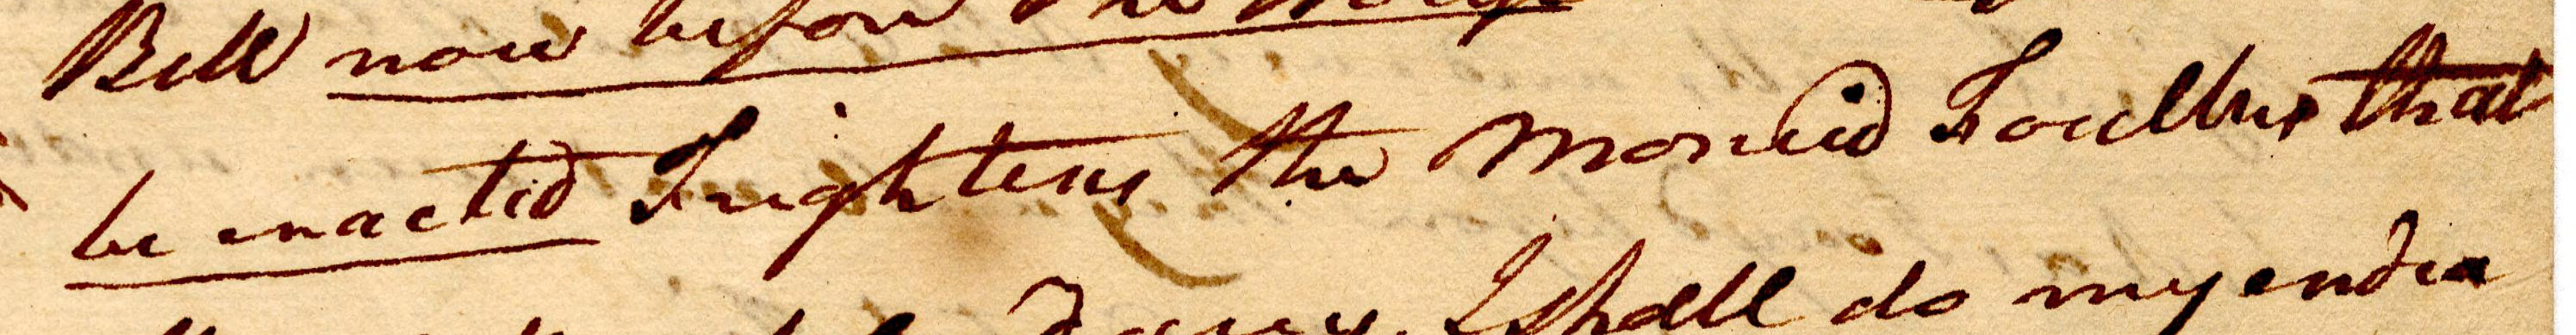be enacted Frightens the monied Foulkes that
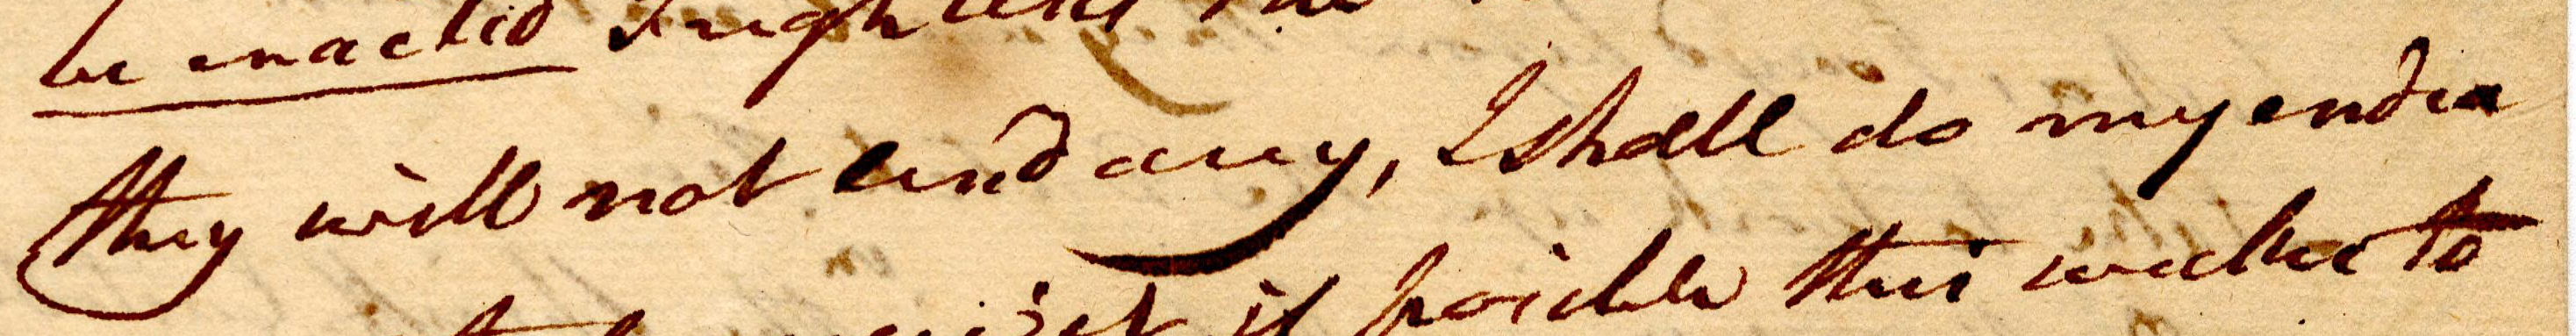they will not lend any, I shall do my endea-
